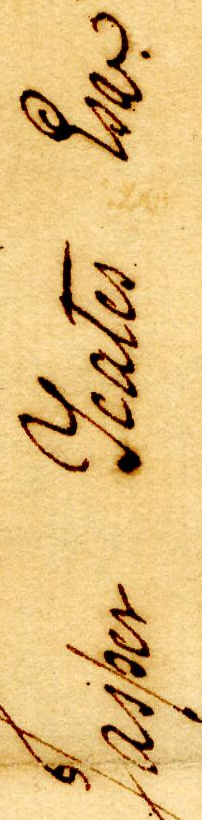Jasper Yeates Esq^r.
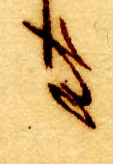at
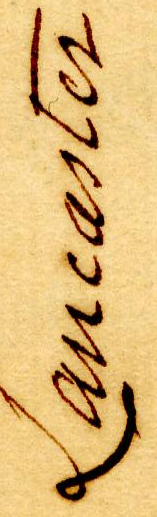Lancaster
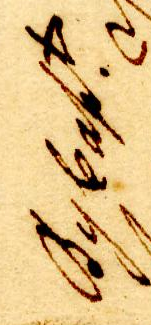By Cap^t.
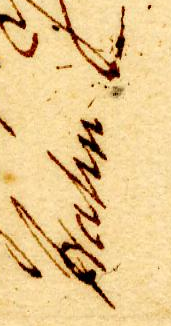Hahn
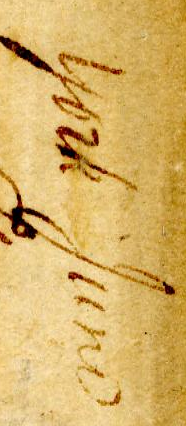York June
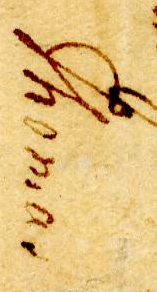Thomas
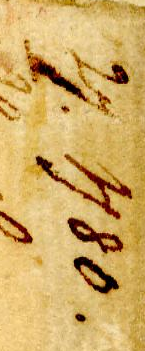27. 1780.
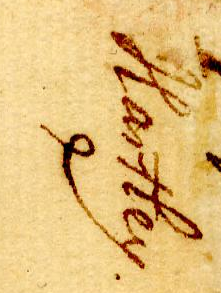Hartley
